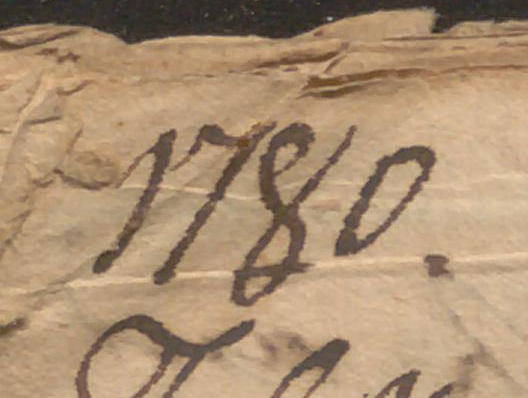1780
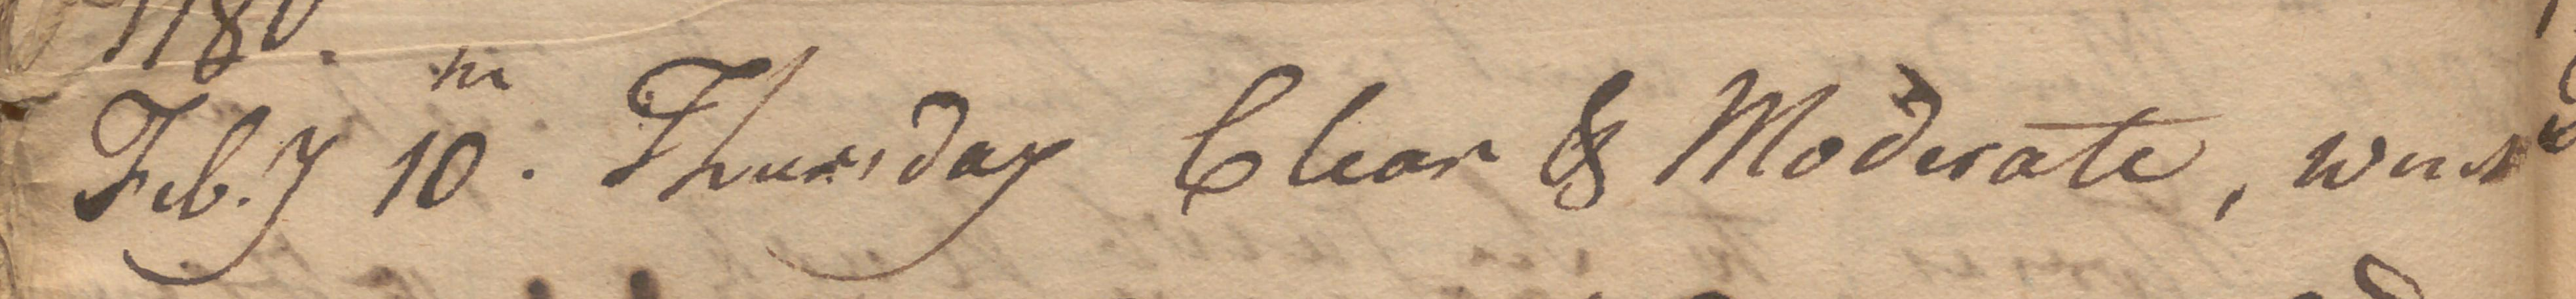Feb^y 10. Thursday Clear & Moderate, went
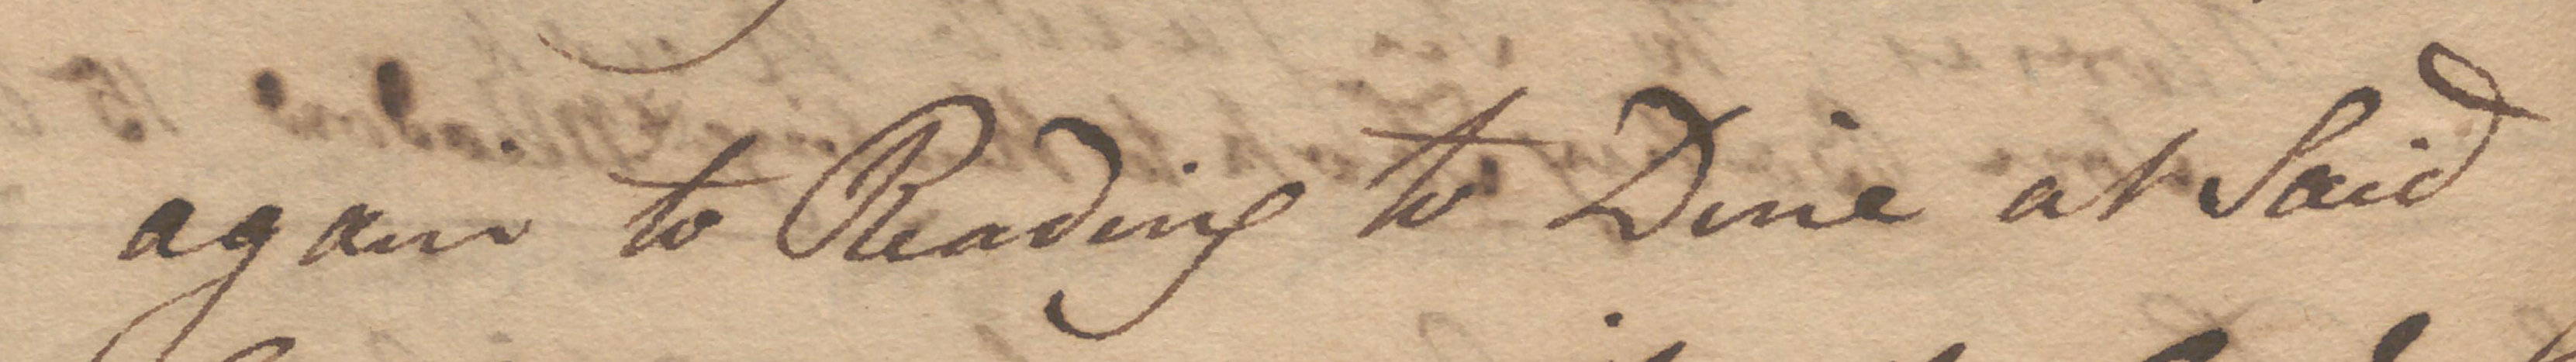again to Reading to Dine at Said
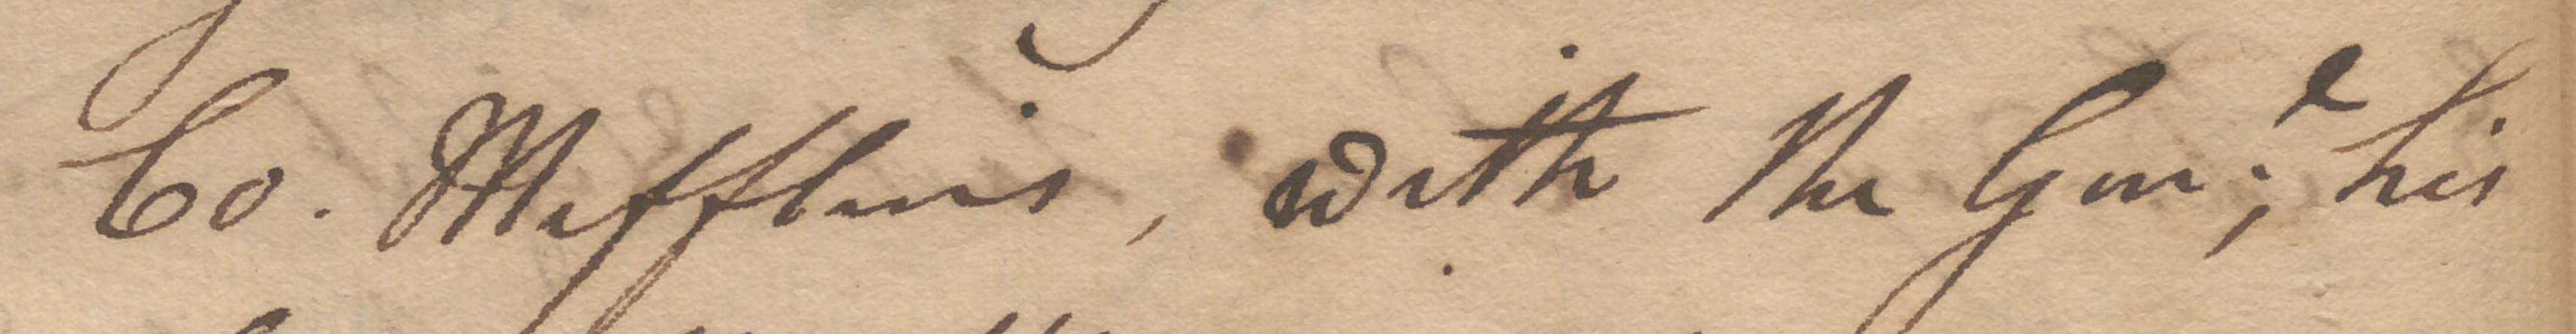Co. Mifflins, with the Gen^l., his
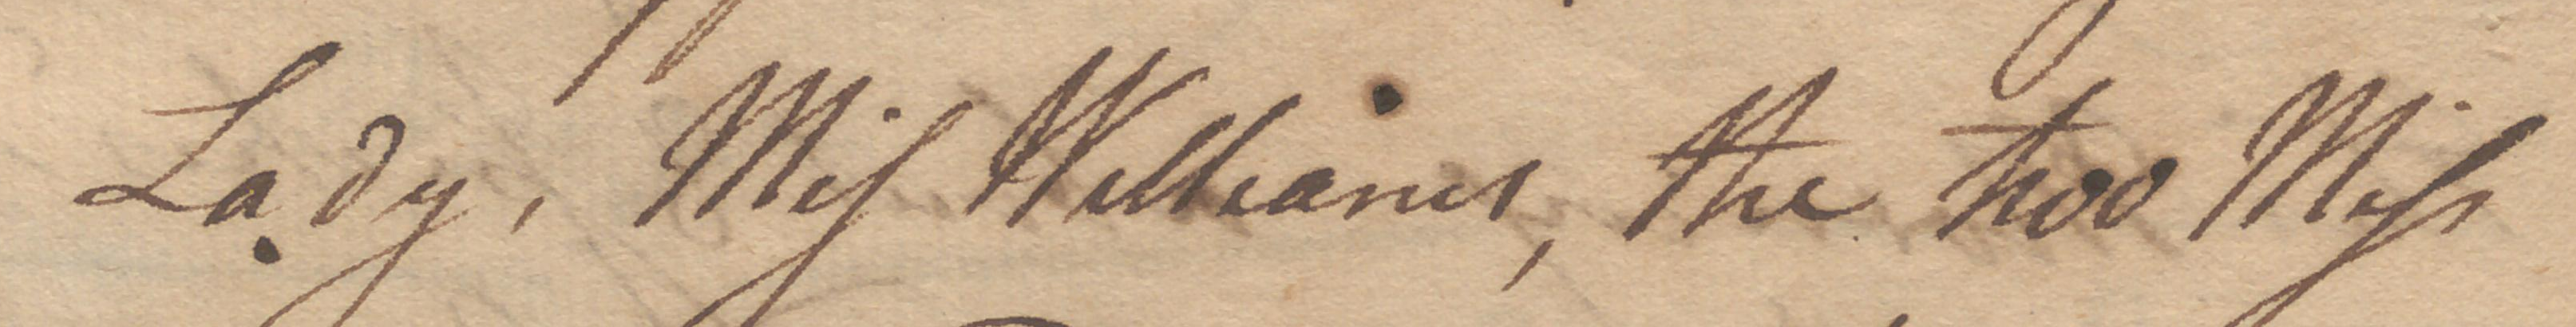Lady, Mis Williams, the two Miss
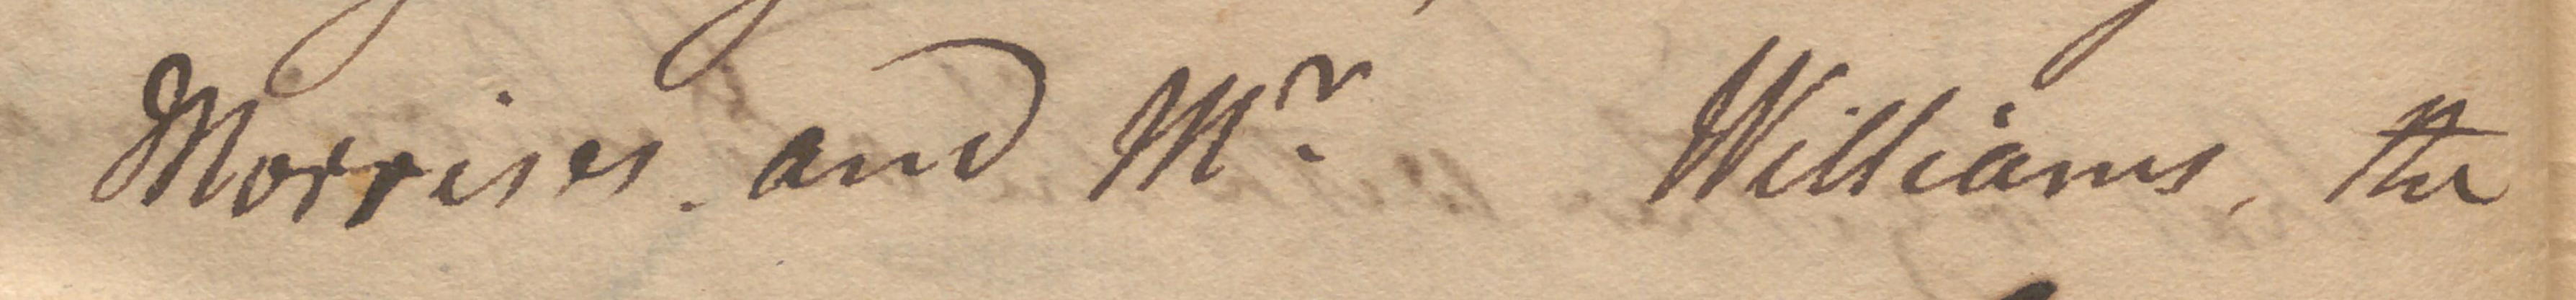Morrises and M^r. Williams, the
